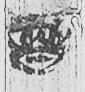晉
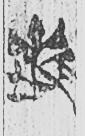襄
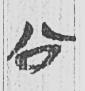公
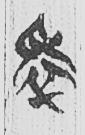卒B
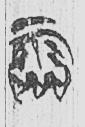霝
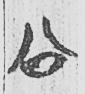公
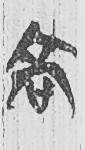高
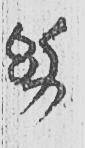幼
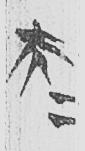夫=
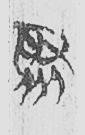聚
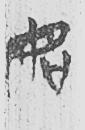{母口}
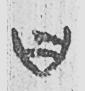曰
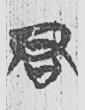君
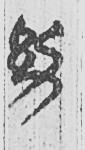幼
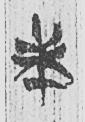未
